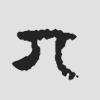亓（其）
